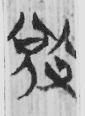敓（說）
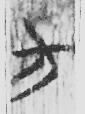方
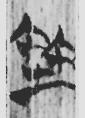{竹土}
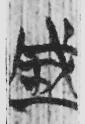城
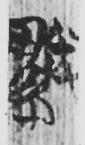縢
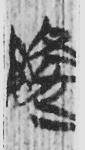{降止}
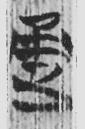{甬止}
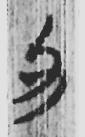力
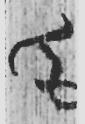氒
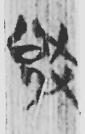敓（說）
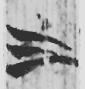之
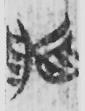{爿頁}
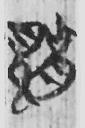鵑
